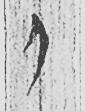人
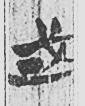或
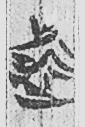涉
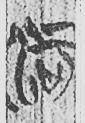河
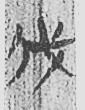伐
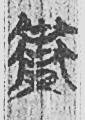衛
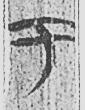于
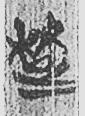楚
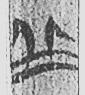丘
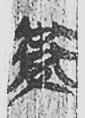衛
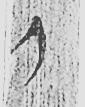人
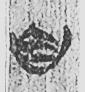自
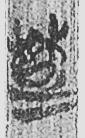楚
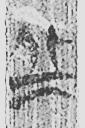丘
